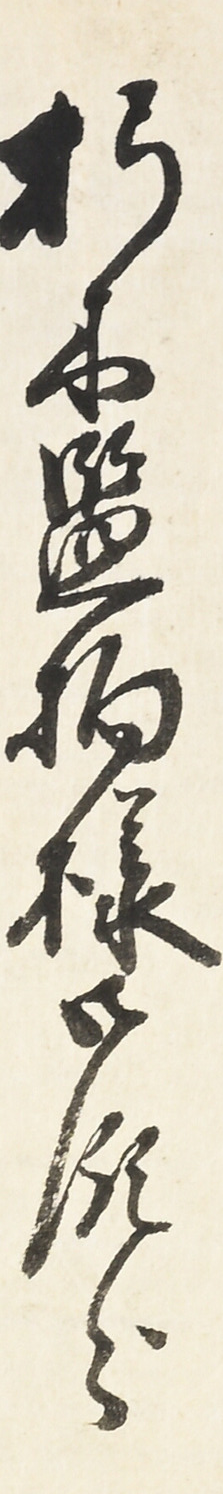朽木監物様御領分
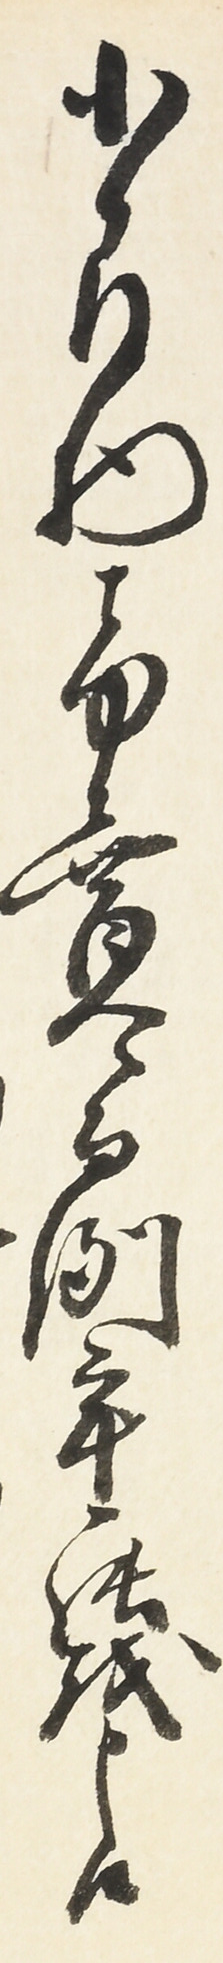小間物商売ニ而例年罷越申候
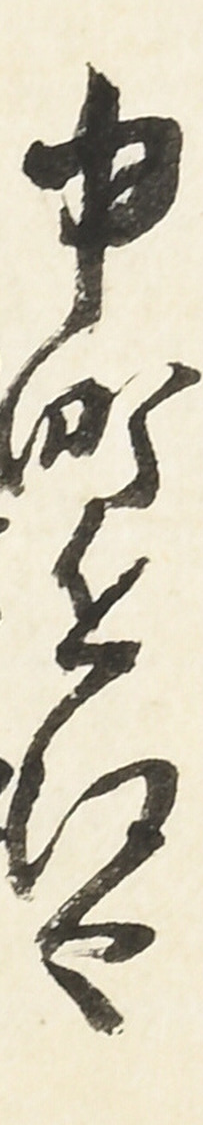中町近江や
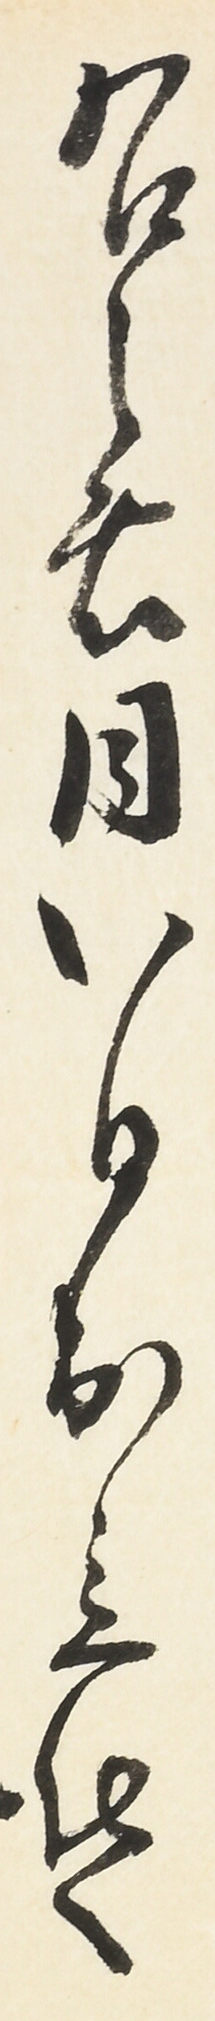右之者同八日出立仕候
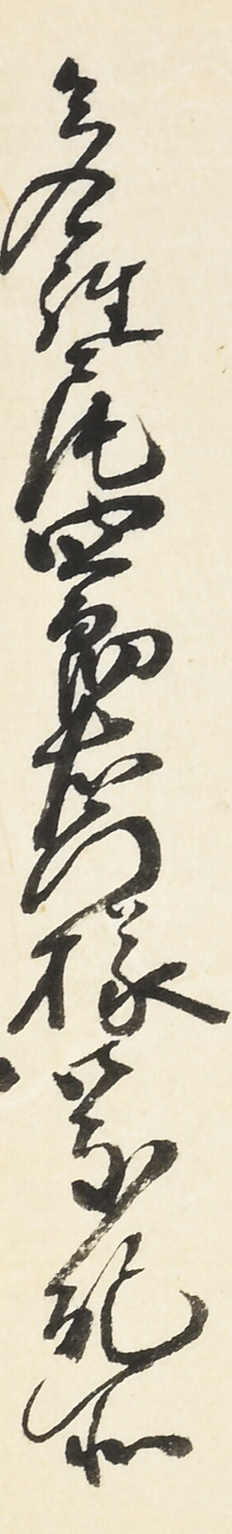多羅尾四郎右衛門様御支配所
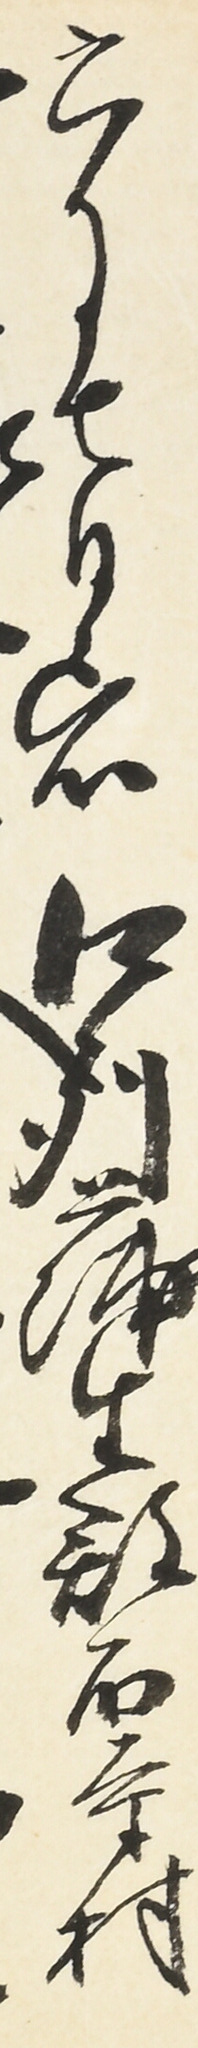六月七日着江州蒲生郡石寺村
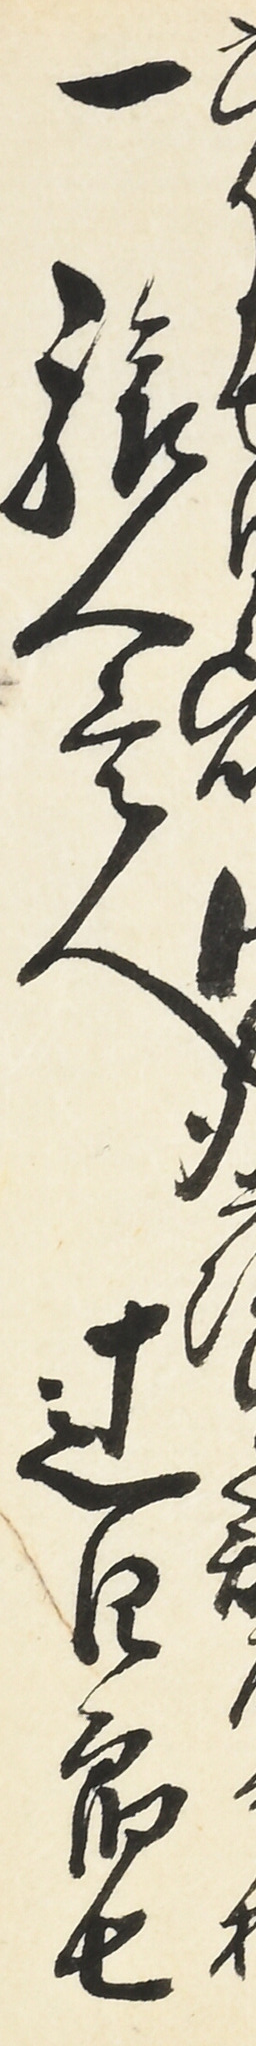一旅人壱人辻四郎七
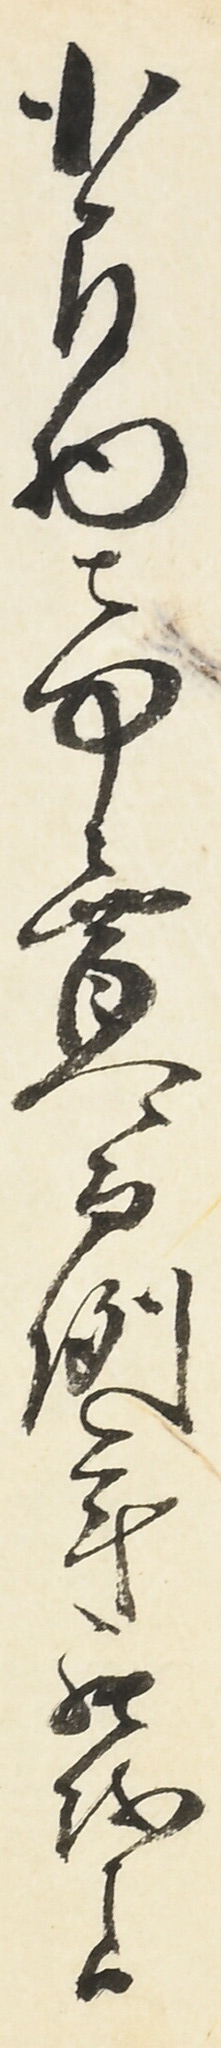小間物商売ニ而例年罷越申候
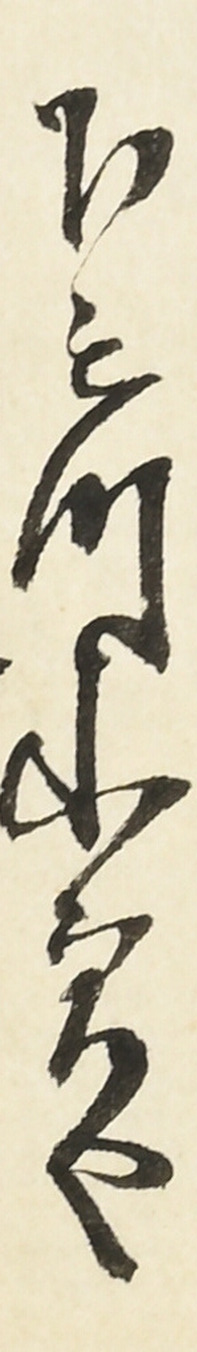下モ町木曽や
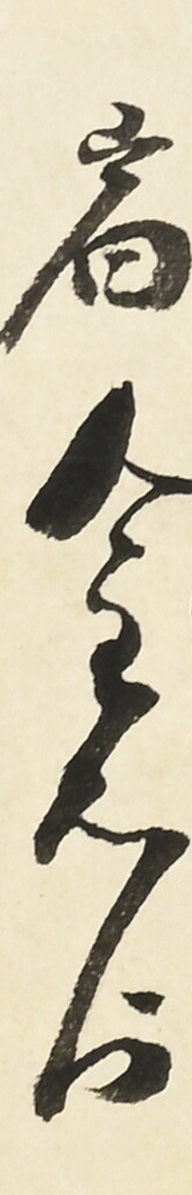宿金右衛門
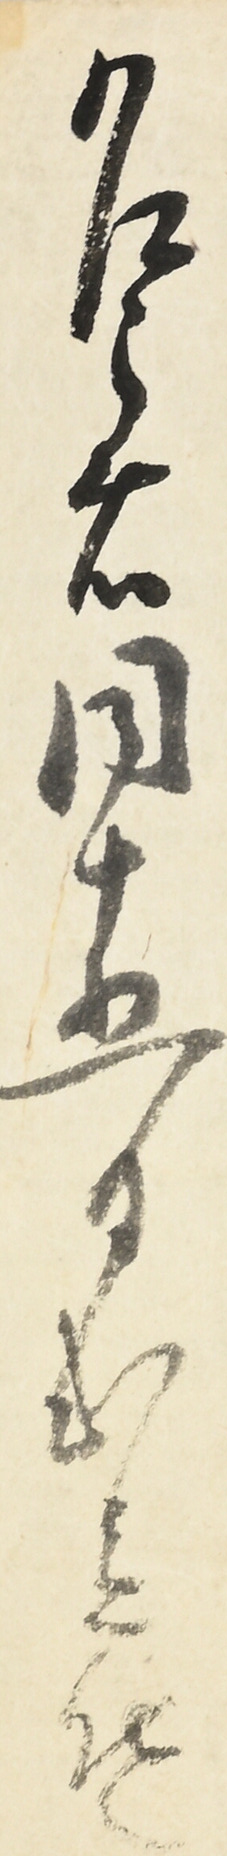右之者同十五日出立仕候

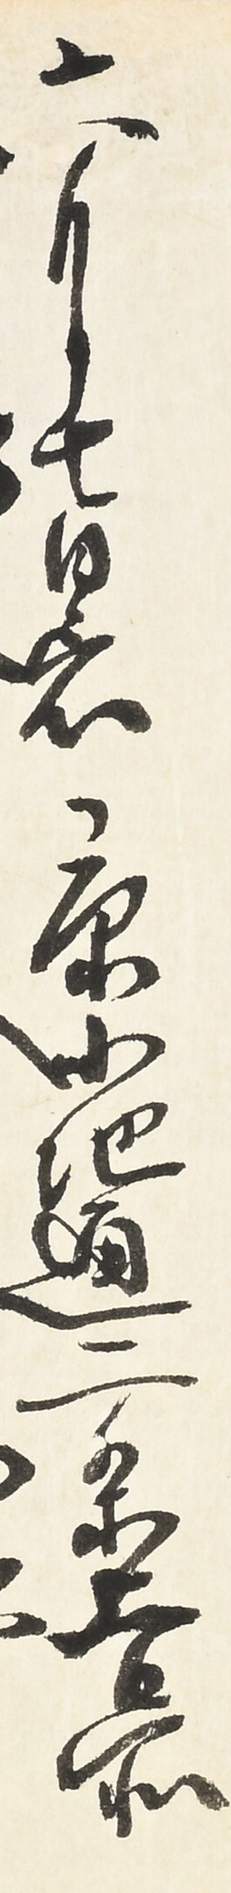六月七日着京小池通二条上ル所
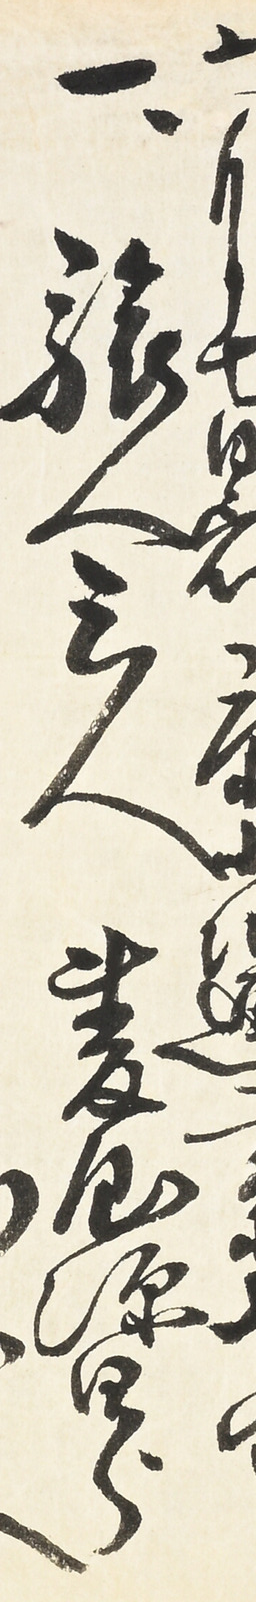一旅人三人菱屋源四郎
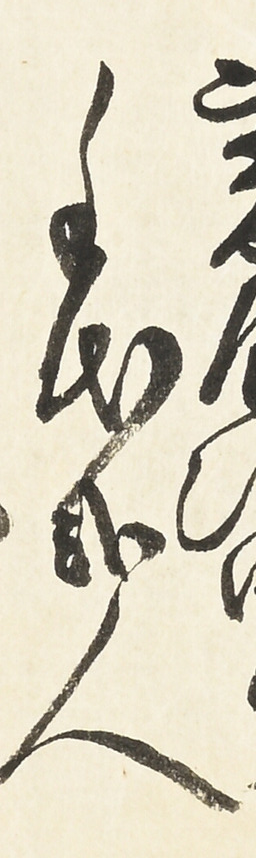手代弐人
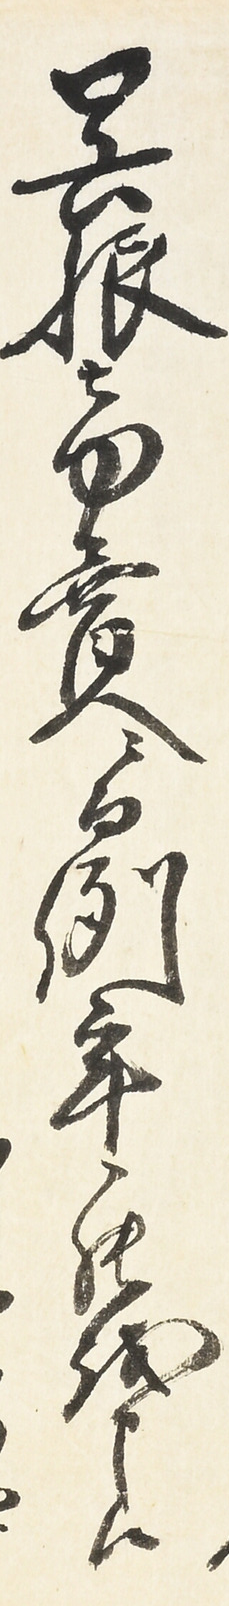呉服商売ニ而例年罷越申候
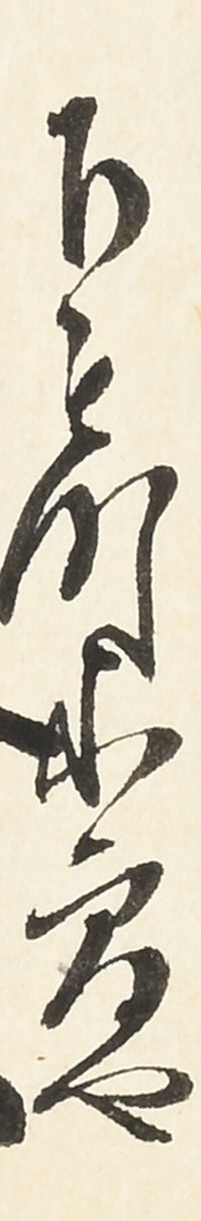下モ町木曽や
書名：町中旅人泊控帳
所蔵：伊那市立高遠町図書館・合同会社AMANE
